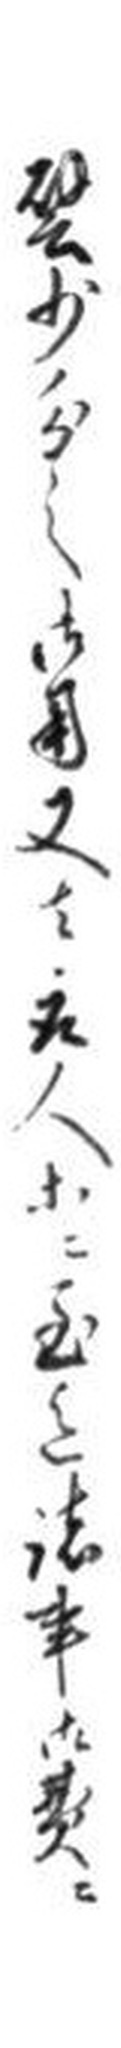譬少分之御用又者取人等ニ至迄諸事御費ニ
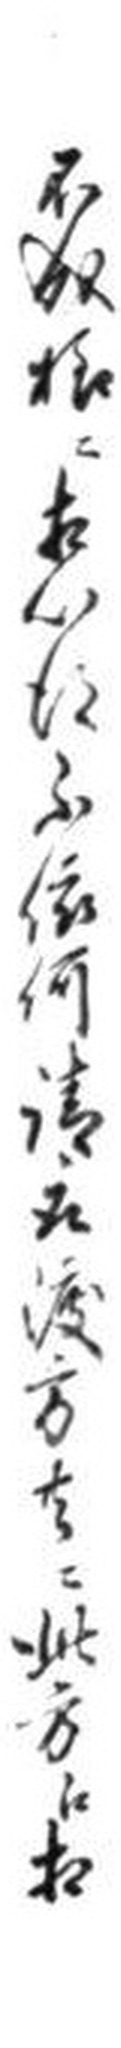不成様ニ相心得不依何請取渡方共ニ此方江相
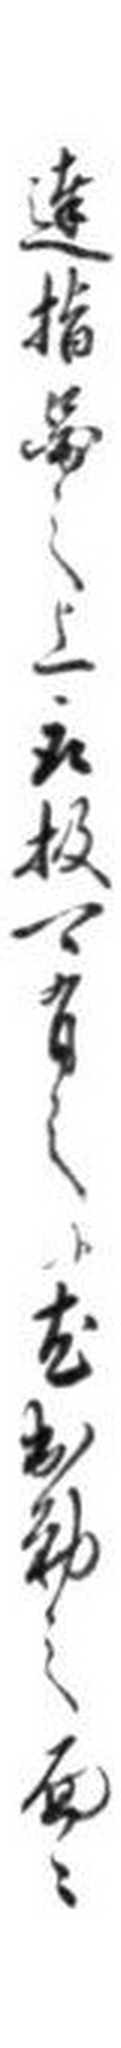達指図之上取扱可有之候尤出勤之面々
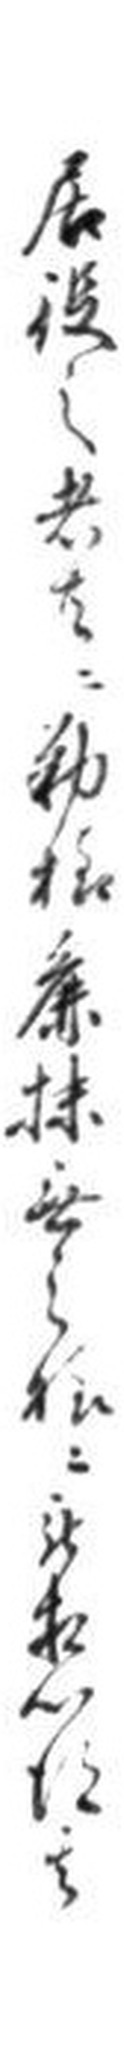居役之者共ニ勤様麁抹無之様ニ被相心得其
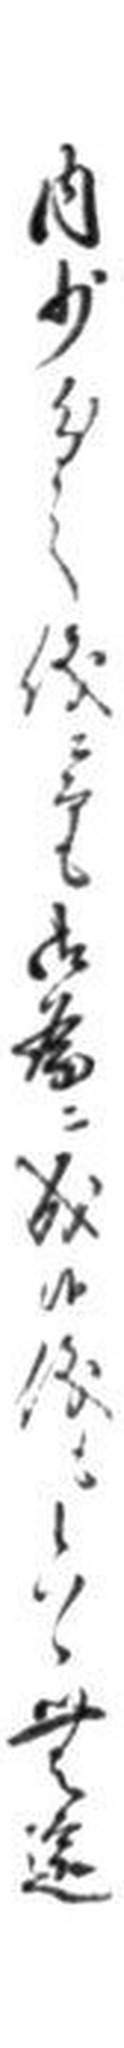内少分之儀ニ而も御為ニ成候儀も候ハヽ無遠
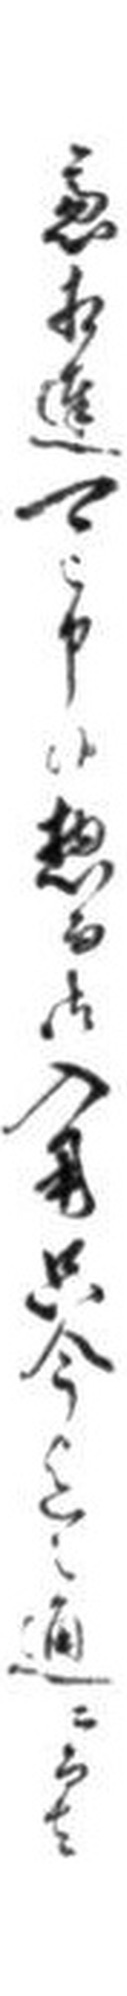慮相達可被申候惣而入用只今迄之通ニ而者
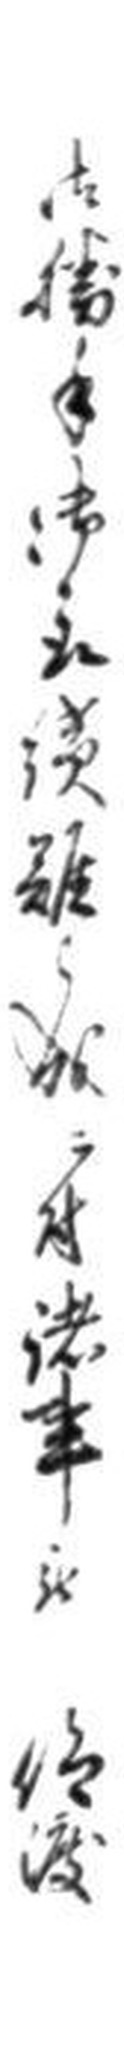御勝手御取続難被成ニ付諸事被仰渡
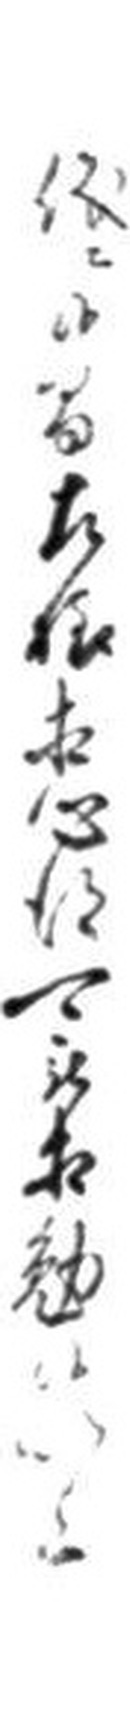儀ニ候間左様相心得可被相勉候以上
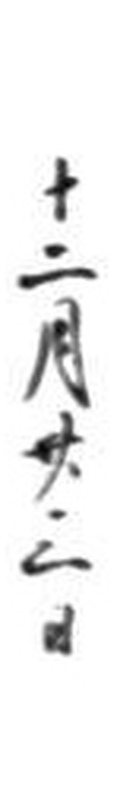十二月廿三日
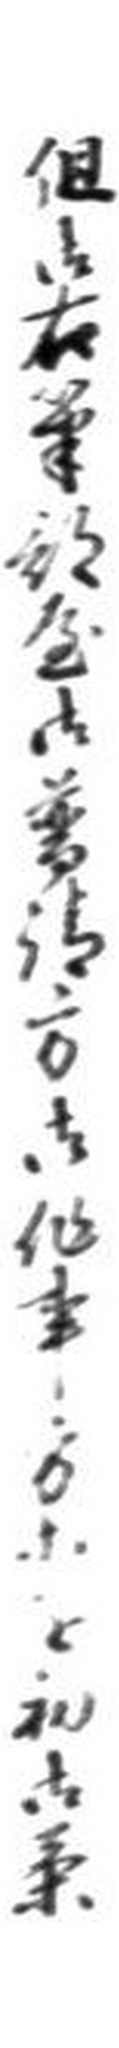但御右筆部屋御普請方御作事方等を初御茶
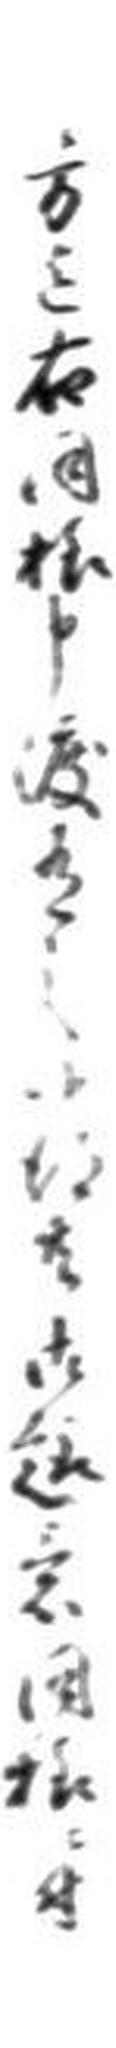方迄右同様申渡有之候得共御趣意同様ニ付
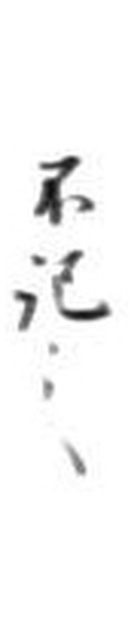不記之
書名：家譜 三十五 宗昌公 従享保六年到同七年
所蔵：福井県文書館 Fukui Prefectural Archives
